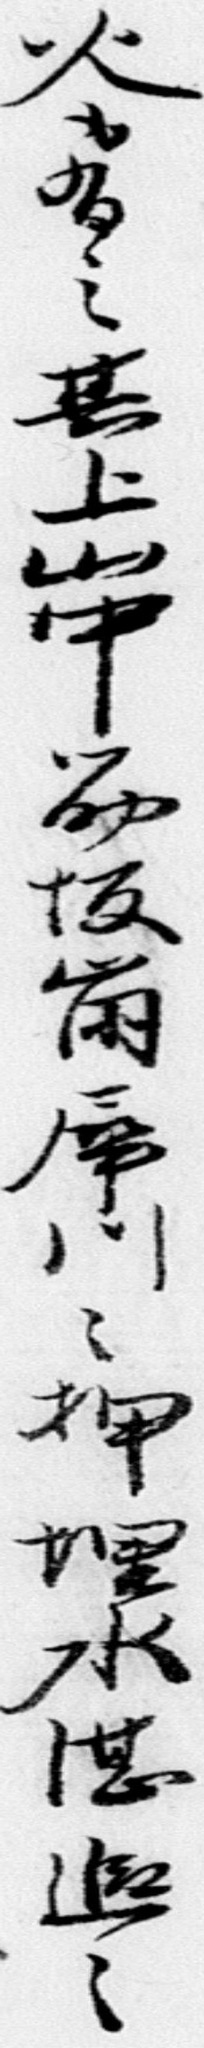火も有之其上山中筋坂崩犀川之押埋水湛追々
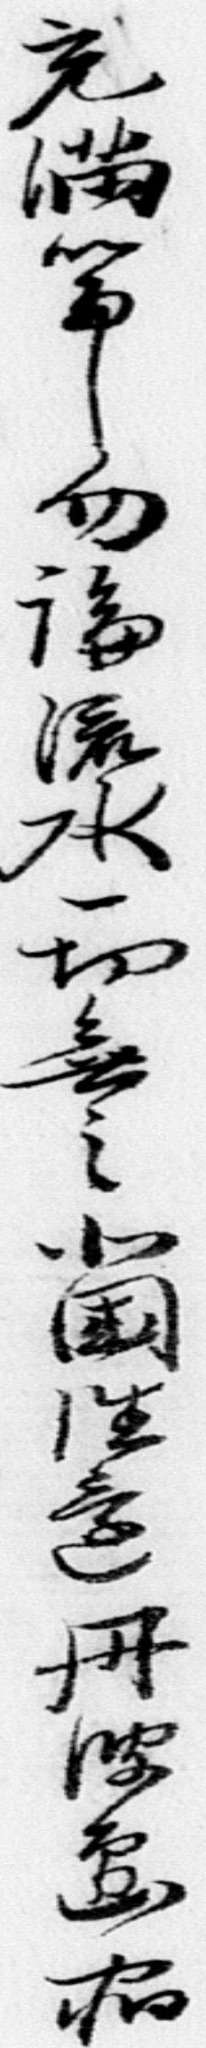充満いたし勿論流水一切無之北国往還丹波島宿
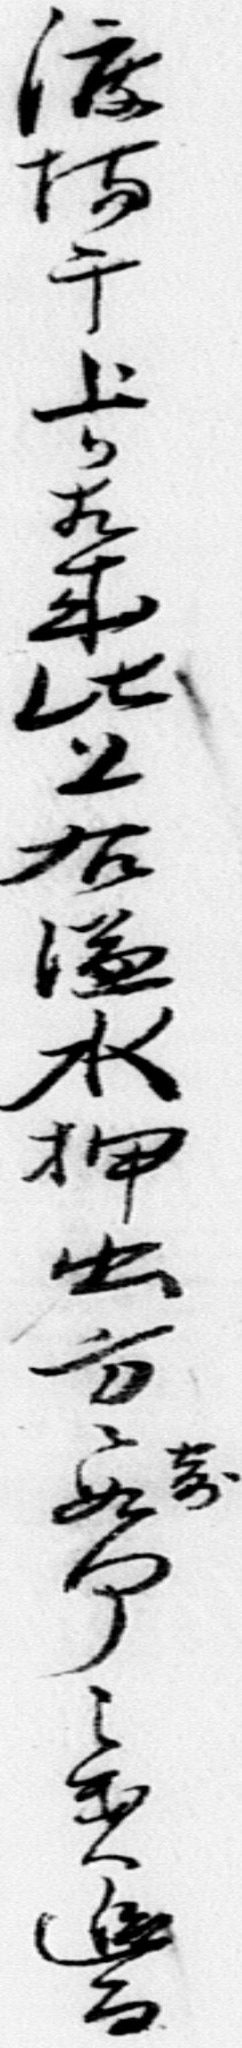渡場干上り相成此上右溢水押出方に寄如何之義は追而
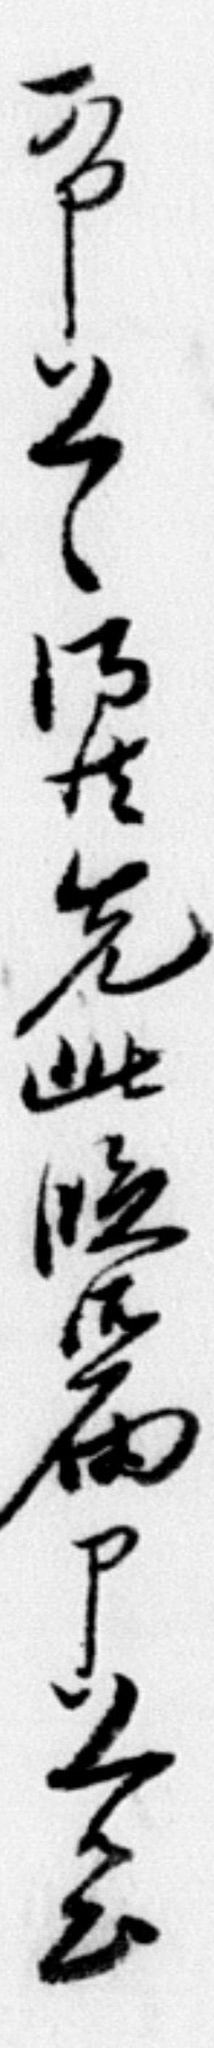可申上候得共先此段御届申上候以上
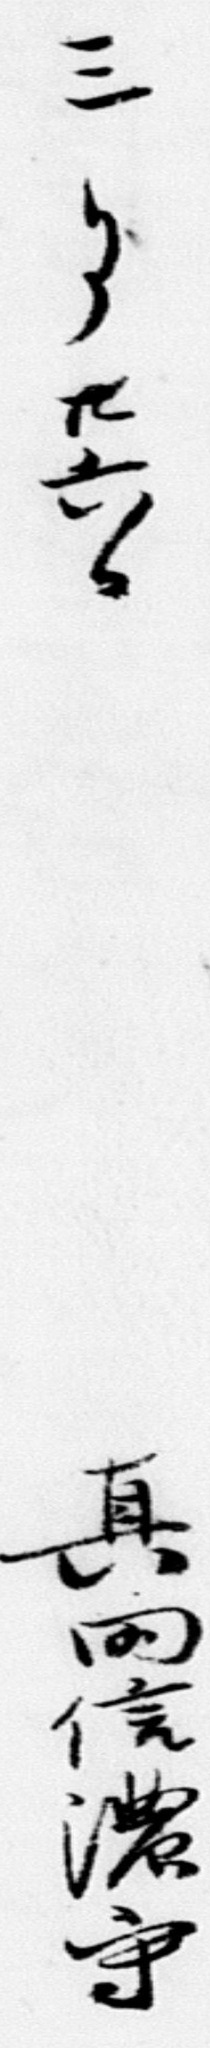三月廿六日真田信濃守
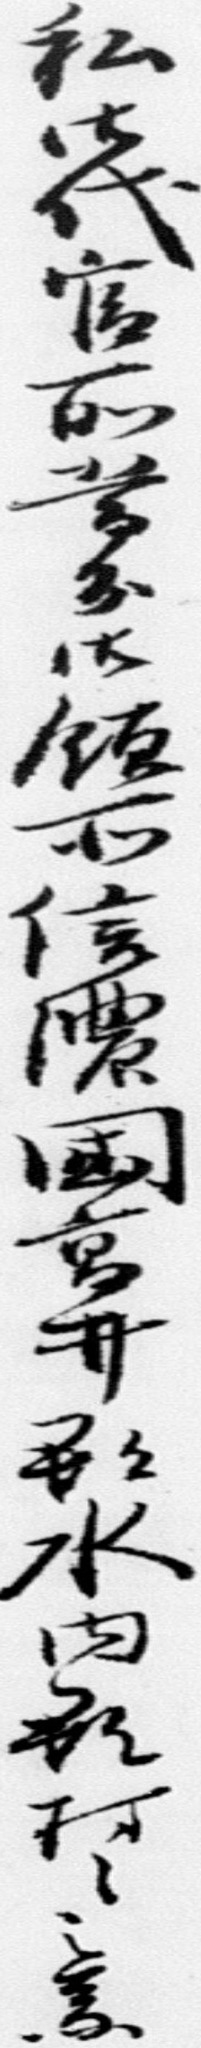私御代官所当分御領所信濃国高井郡水内郡村々之義
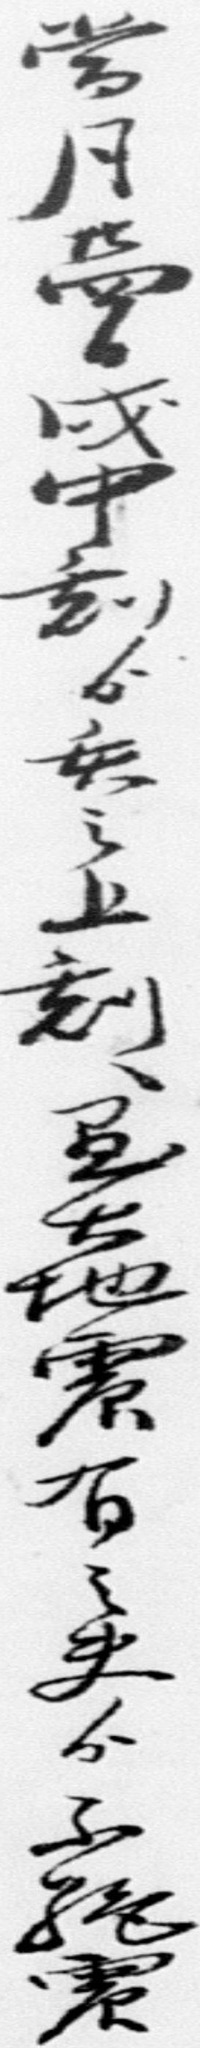当月廿四日戌中刻ゟ亥之上刻へ懸大地震有之夫ゟ不絶震
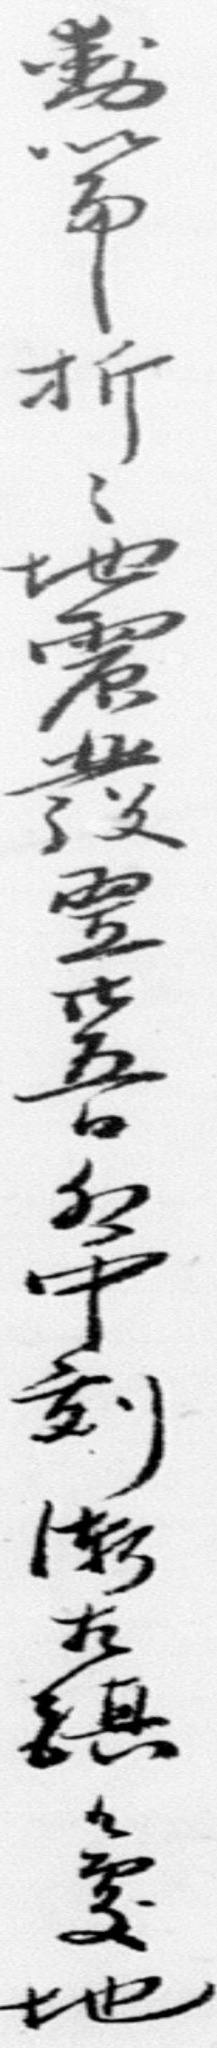動いたし折々地震発翌廿五日卯中刻漸相鎮候処地
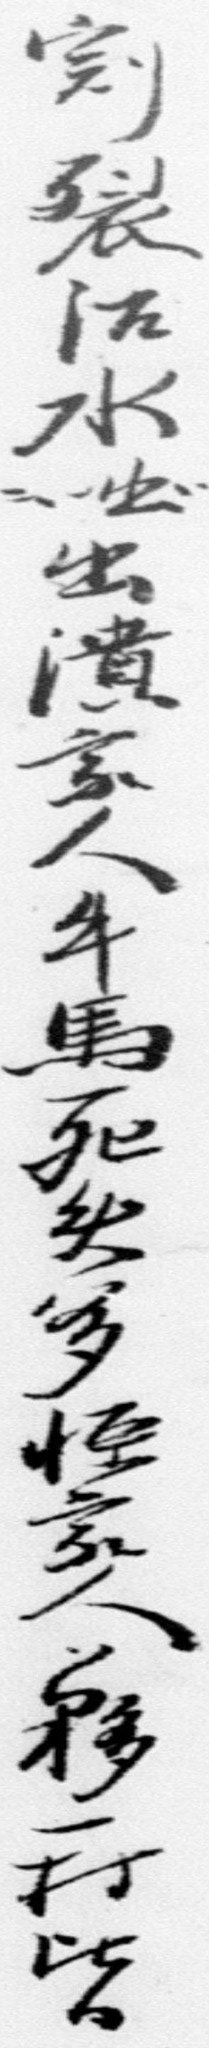割裂泥水吐出潰家人牛馬死失多怪我人は夥一村皆
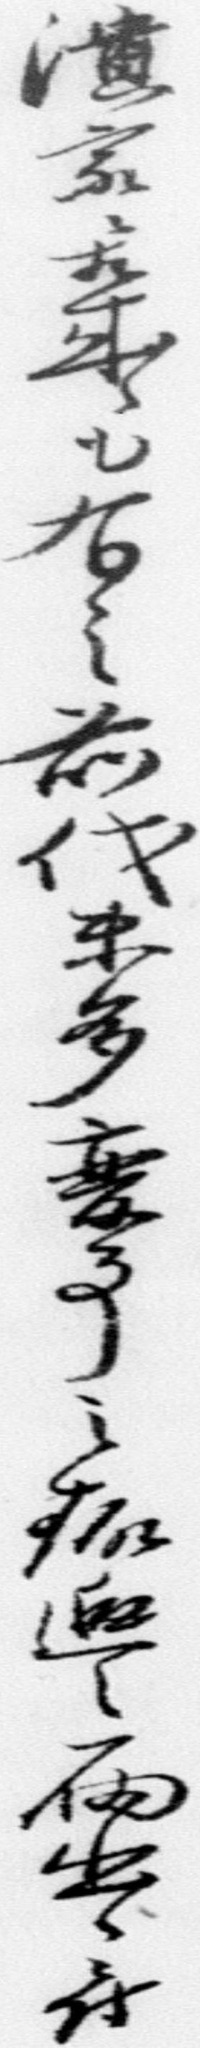潰家に相成候も有之前代未聞変事之趣追々届出候に付
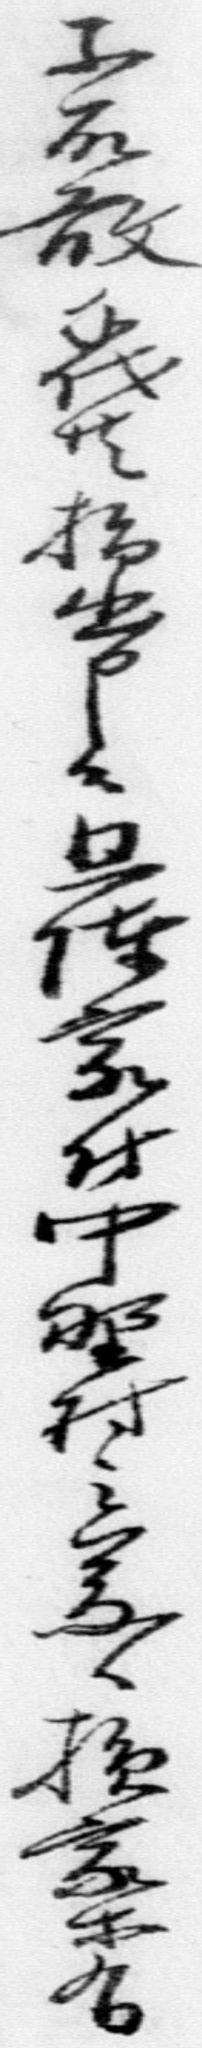不取敢手代共指出申候且陣家付中野村之義は損家等有
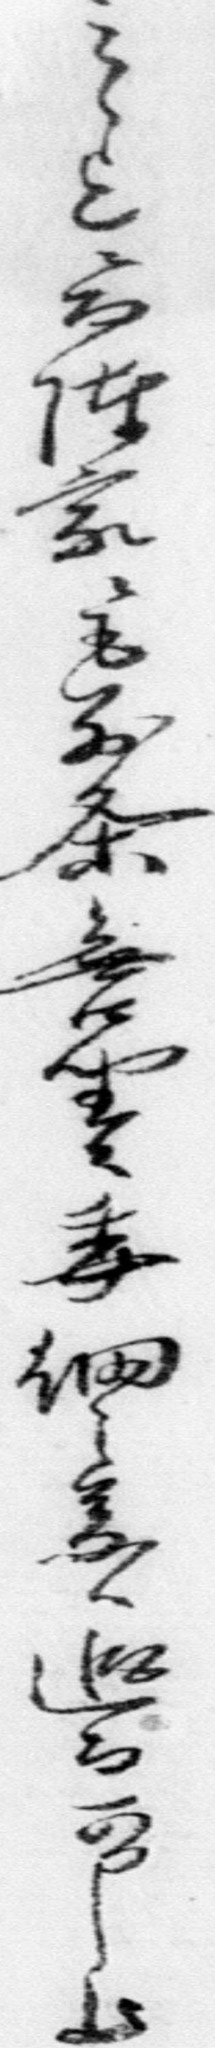之迄に而陣家にも別条無御座候委細之義は追而可申上
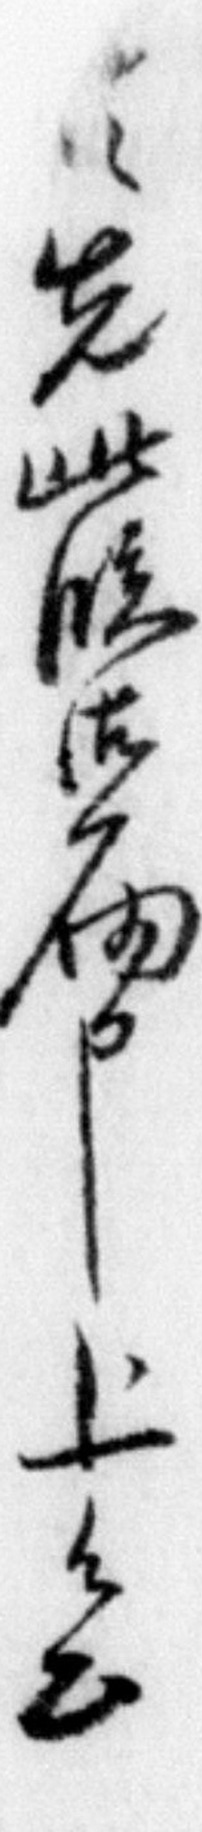共先此段御届申上候以上
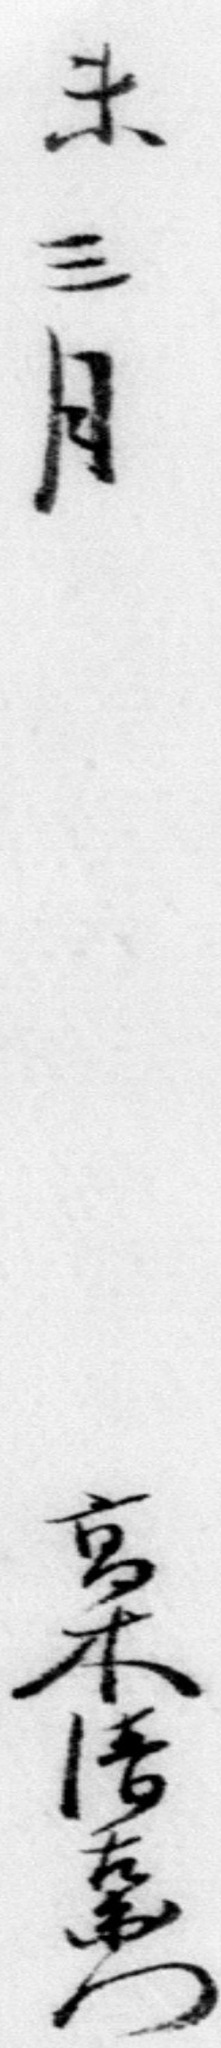未三月高木清右衛門

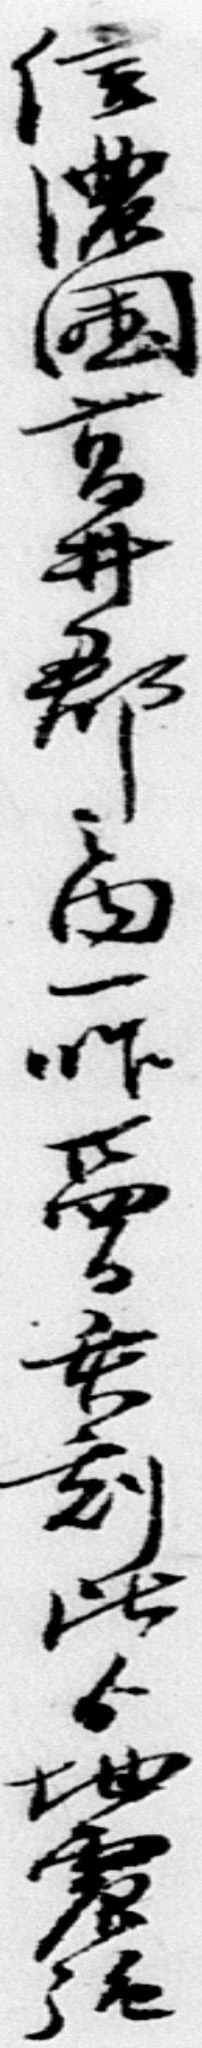信濃国高井郡之内一昨廿四日亥刻頃ゟ地震強
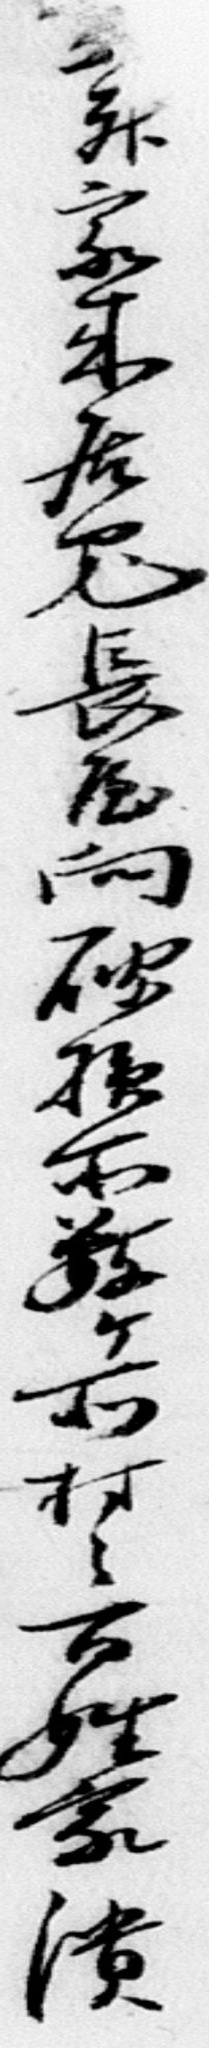幷家来居宅長屋向破損所数ケ所村々百姓家潰
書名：信州大地震一件
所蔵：徳島県立図書館
